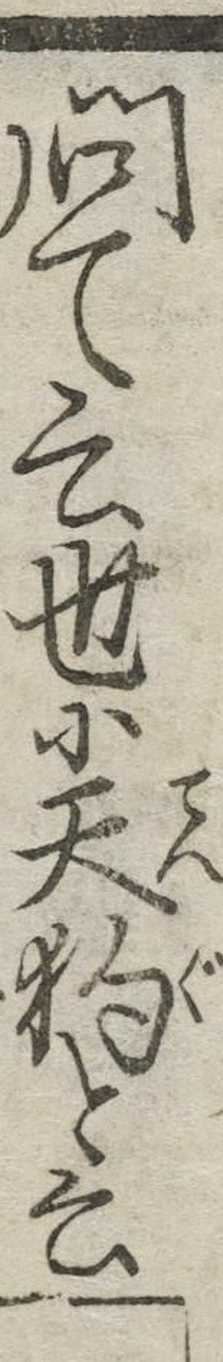問て云世に天狗と云
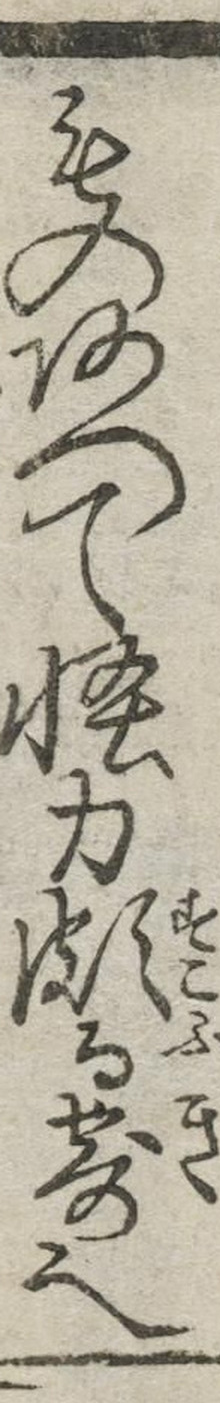ものあつて怪力頗る奇也
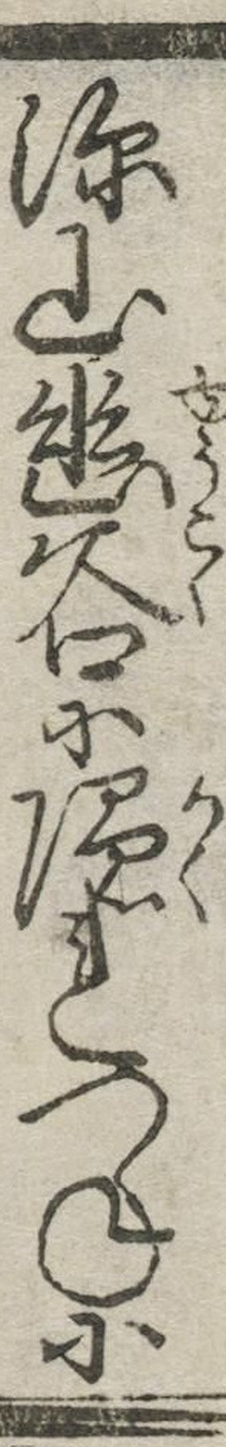深山幽谷に隠れつねに
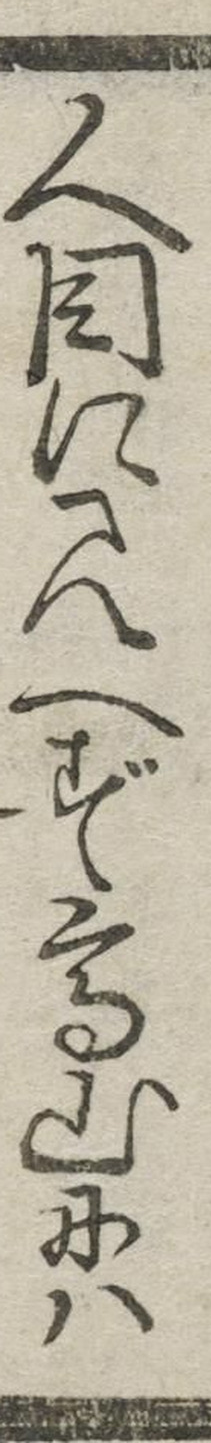人目に見へず高山には
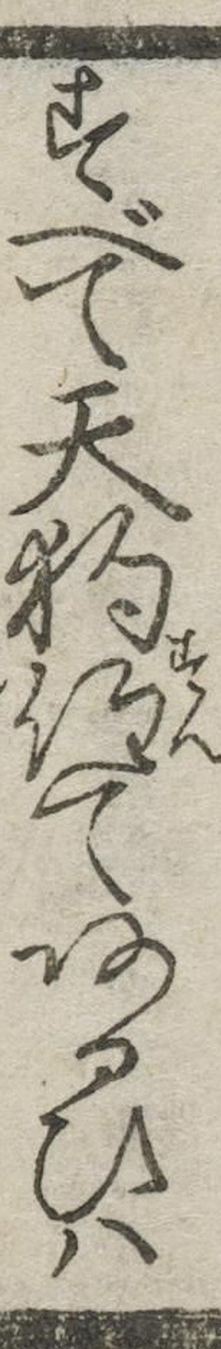すべて天狗住てあるひは
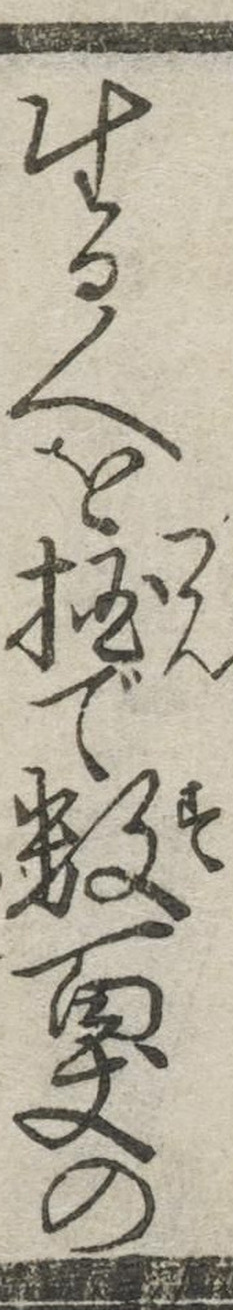生る人を掴で数百丈の
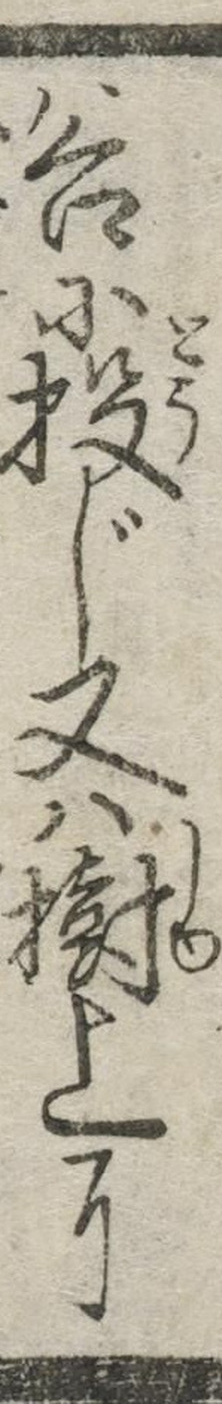谷に投じ又は樹上に
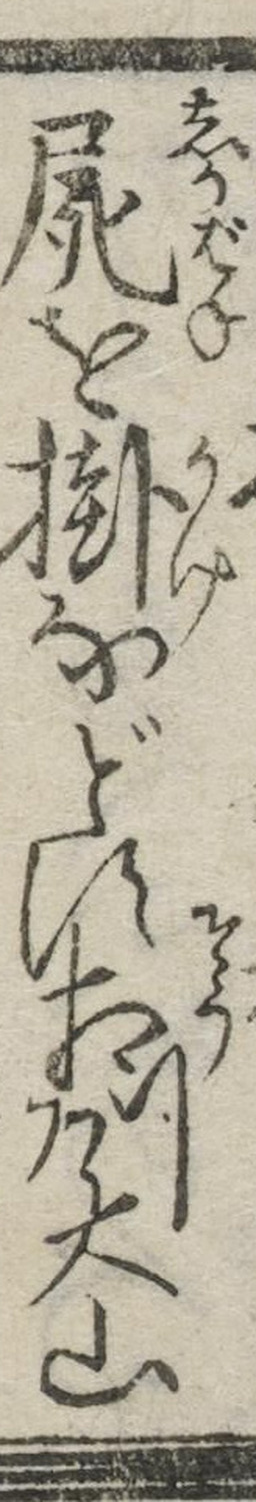屍を掛などす相州大山
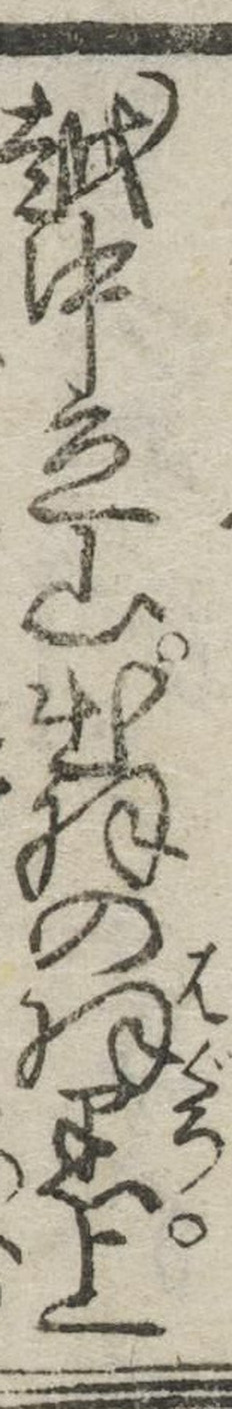越中立山。出羽の羽黒。上

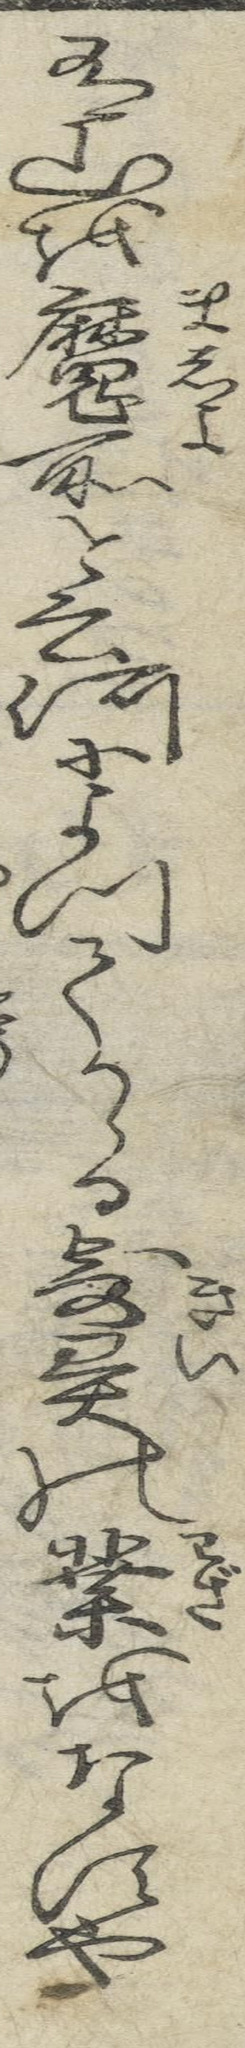有山を魔所と云何によつてかゝる奇異の業をなすや
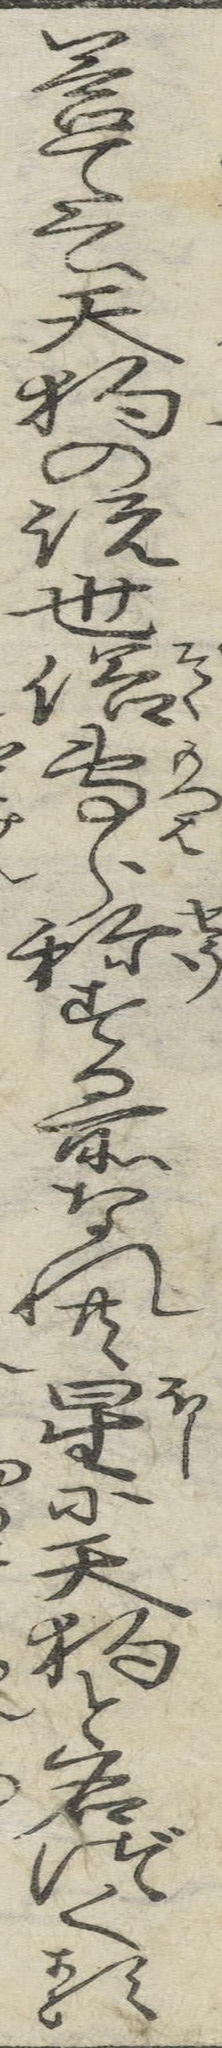答て云天狗の説世俗専ら称する所なれども星に天狗と名ずくる
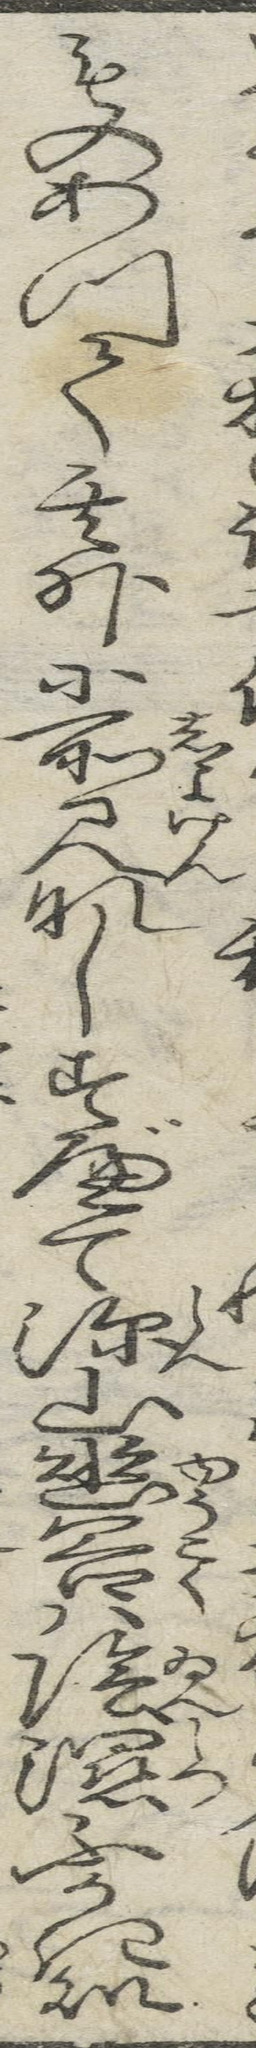ものあつて其所に所見なしすべて深山幽谷陰湿ふかき処
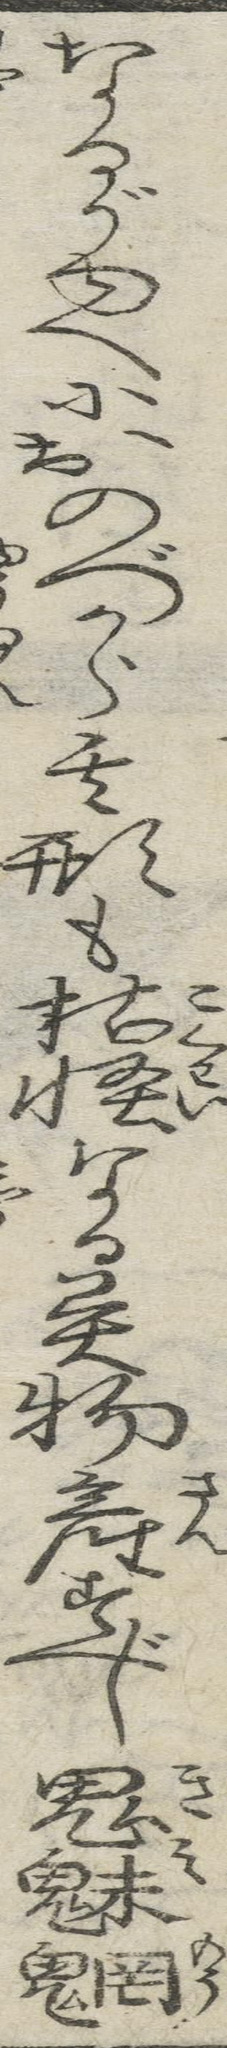なるがゆへにおのづから其形も枯怪なる異物産すべし鬼魅魍
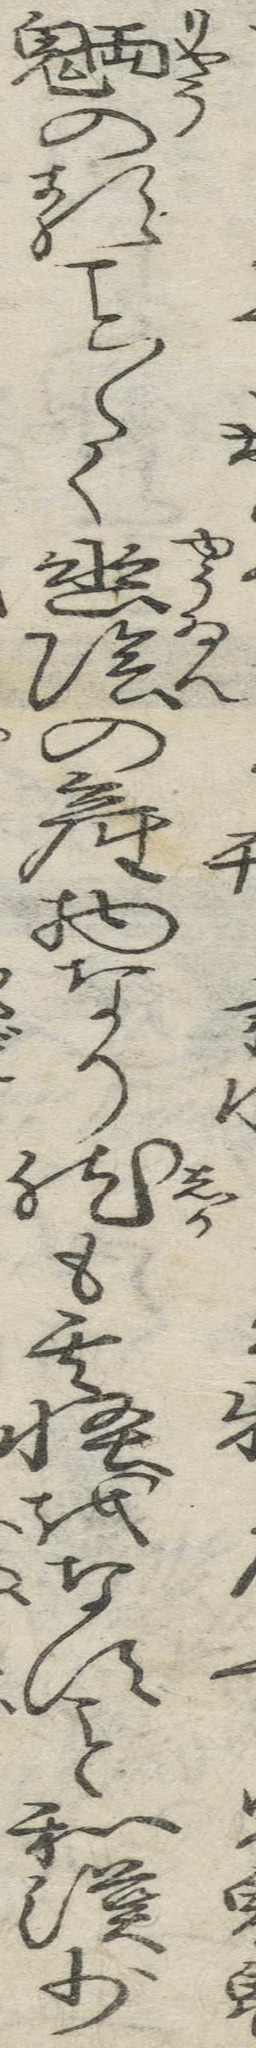魎の類こと〳〵く幽陰の産物なり然も其怪をなすこと和漢少
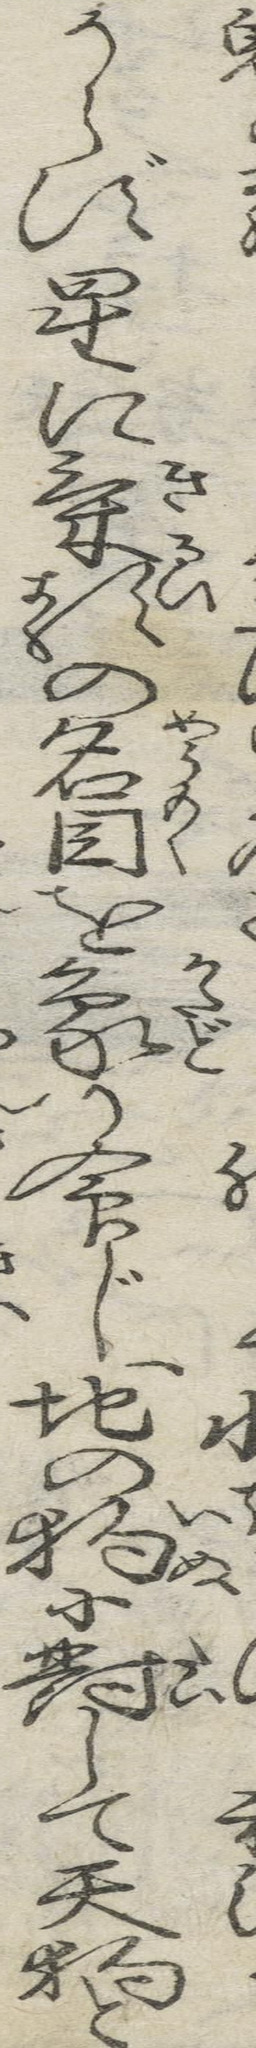からず星に気類の名目を象り命じ地の狗に対して天狗と
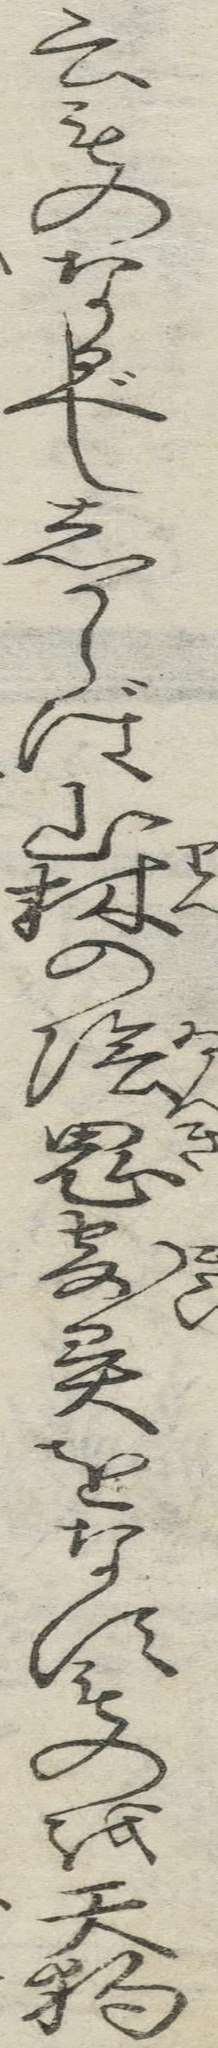云ものなるべししからば山林の陰鬼奇異をなすものを天狗
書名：訓蒙天地辨　地
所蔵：東京大学地震研究所図書室 Earthquake Research Institute Library, The University of Tokyo, JAPAN
